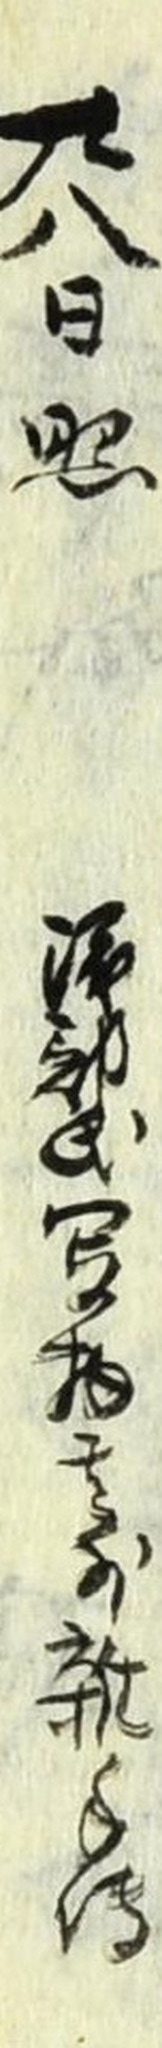廿八日照渡部氏写物其外雑手伝
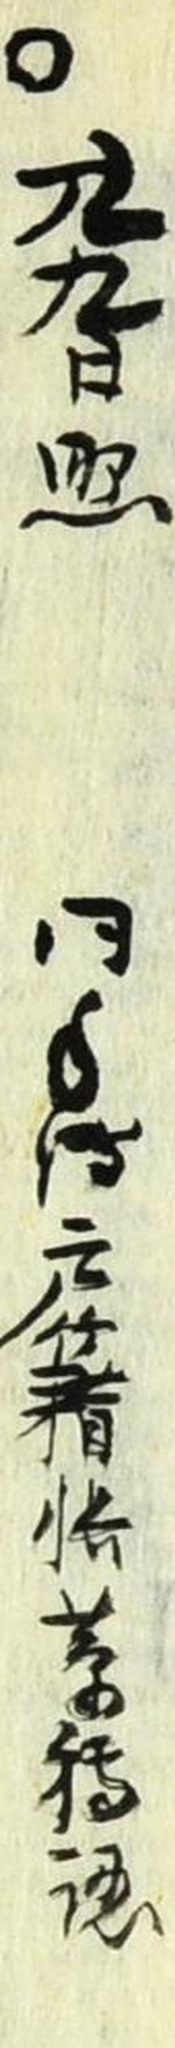○廿九日同手伝戸籍帳草稿認
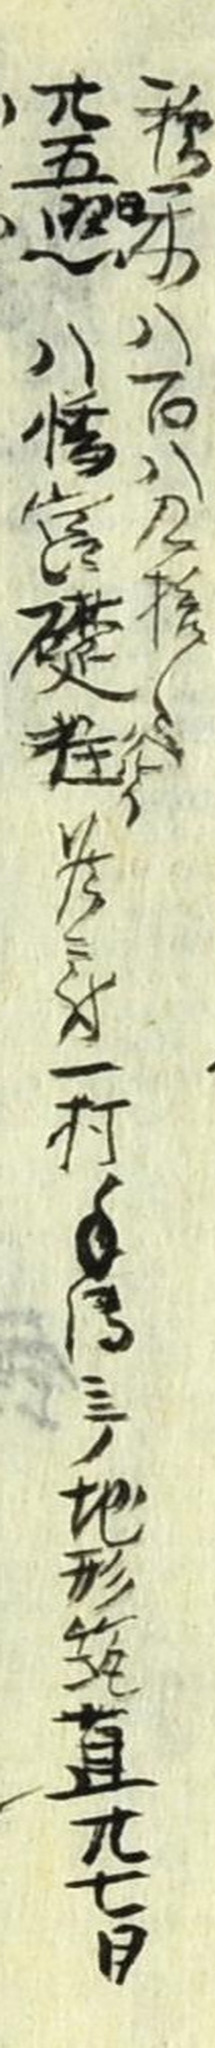廿五照八幡宮礎狂候ニ付一村手伝ニテ地形筑直廿七日
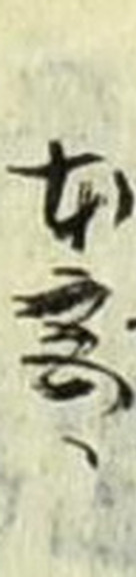本宮へ
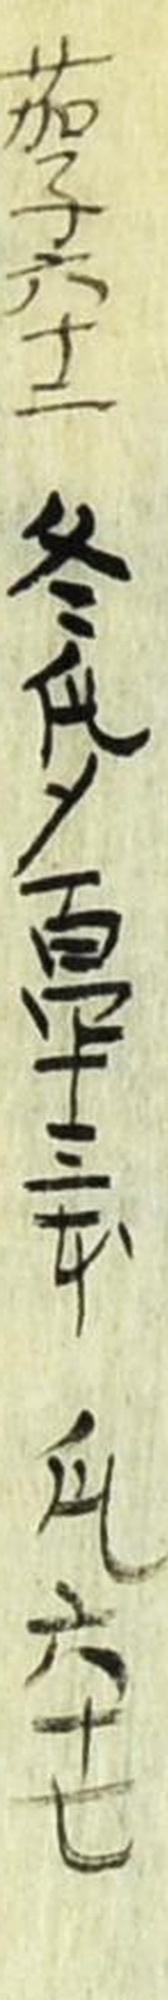茄子六十二冬瓜〆百四十三本瓜六十七

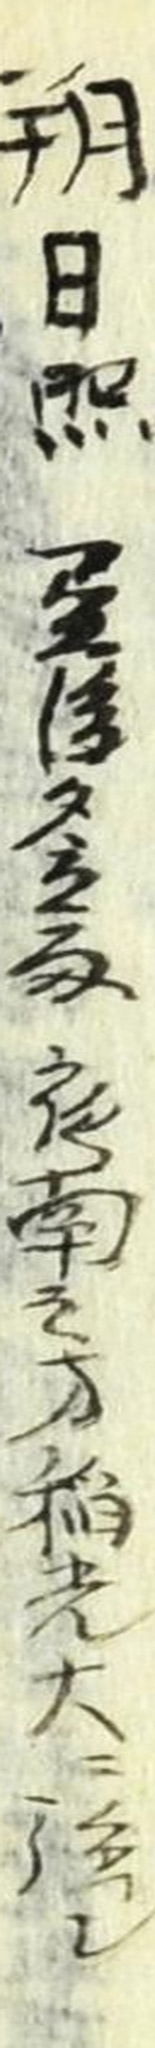朔日照昼後夕立雨夜南之方稲光大ニ強シ
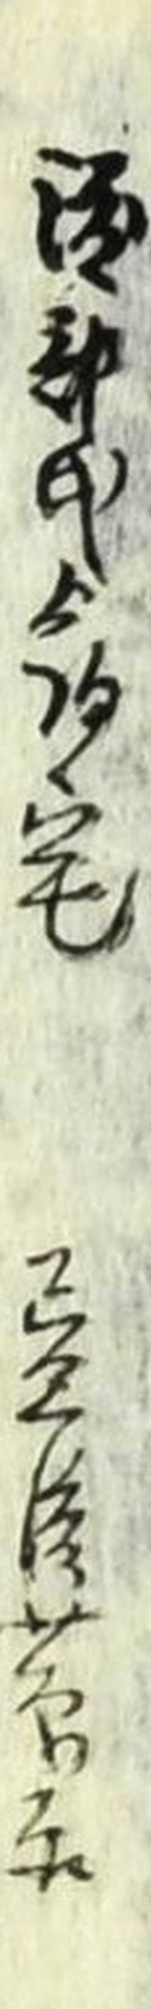渡部氏ゟ帰宅昼後草取
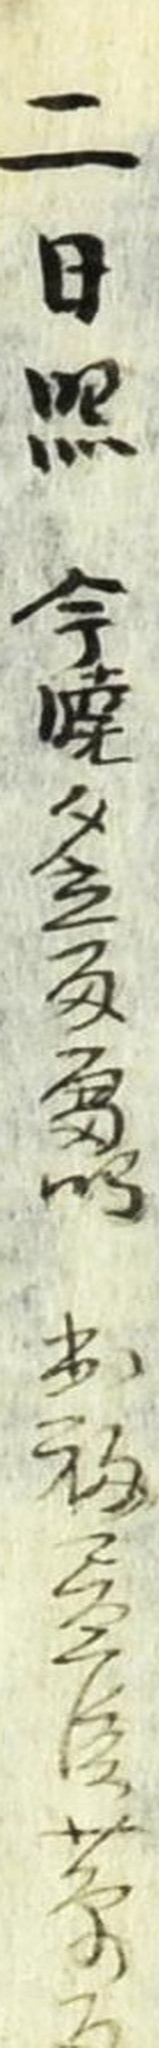二日照今暁夕立雨雷鳴出福昼後草取
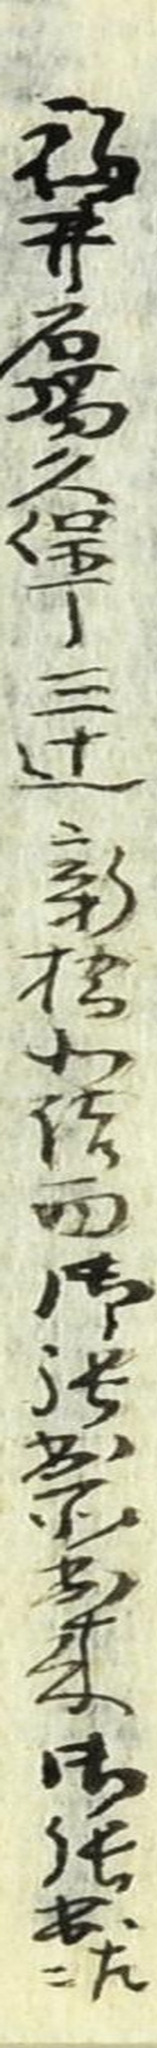福井石場久保丁三辻新橋北詰西御張出所出来御張出左ニ
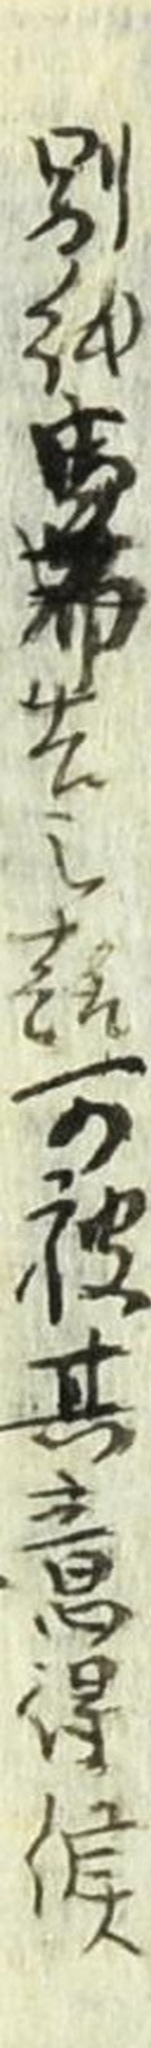別紙御布告之趣可被其意得候
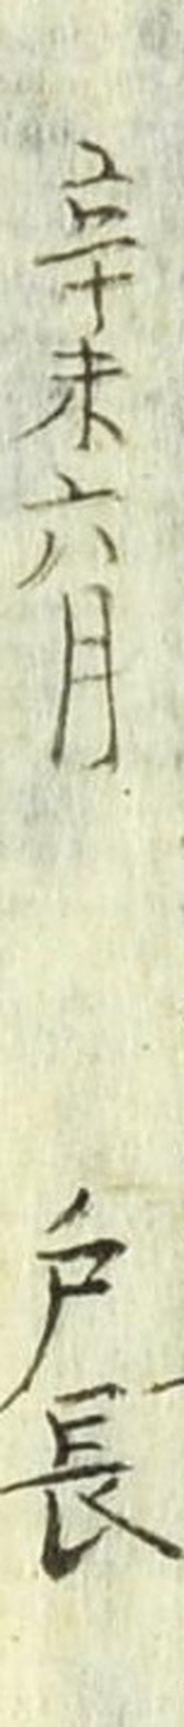辛未六月戸長
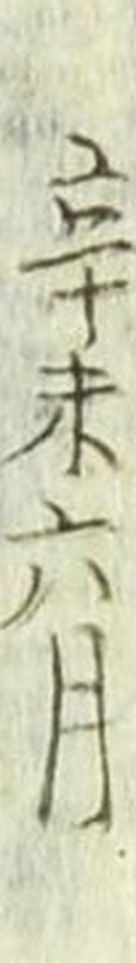辛未六月
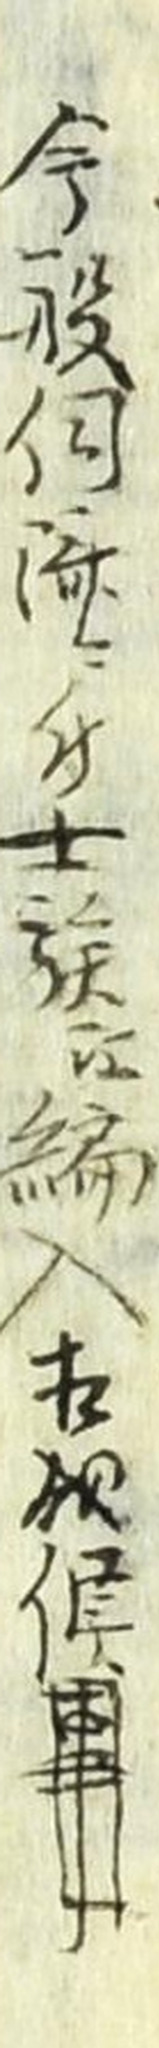今般伺済ニ付士族江編入相成候
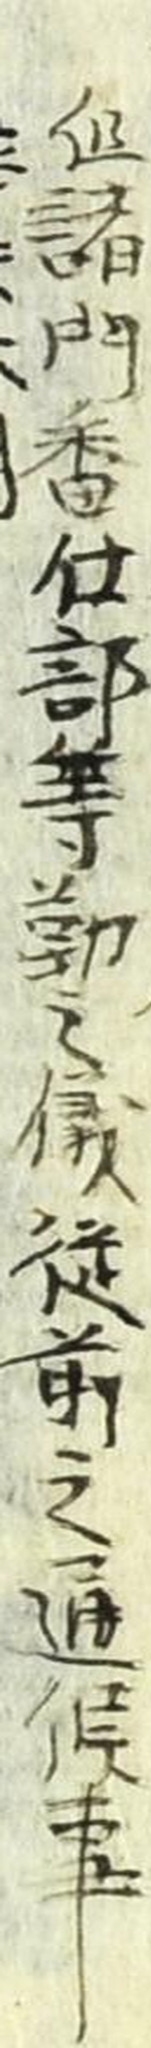但諸門番仕部等勤之儀従前之通候事
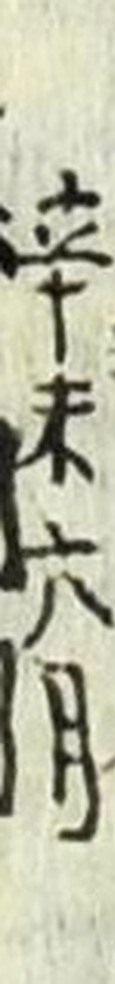辛未六月
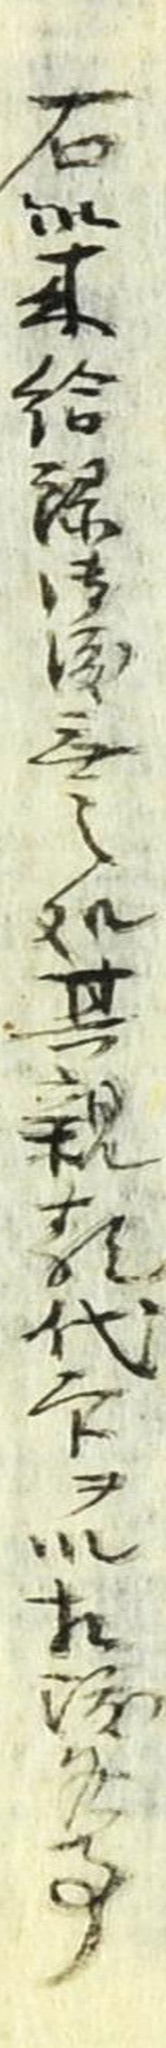右以来給録御渡無之処其親類代印ヲ以相渡候事
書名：（日記）
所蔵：福井県文書館 Fukui Prefectural Archives
